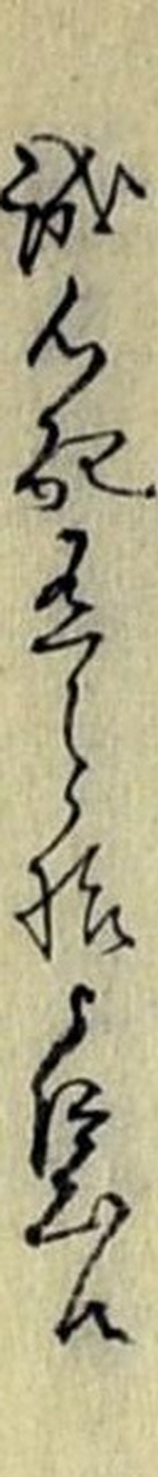誠心配有之候様被仰出候
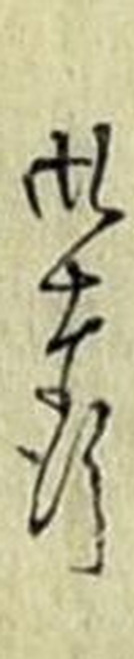御奉行
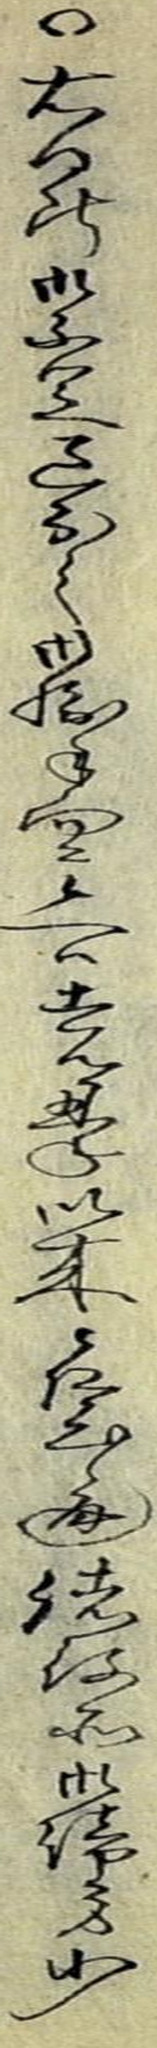○右同断御不宜過分之御勝手向ニ候へハ去ル丑年以来被仰出之通諸役所御締方少
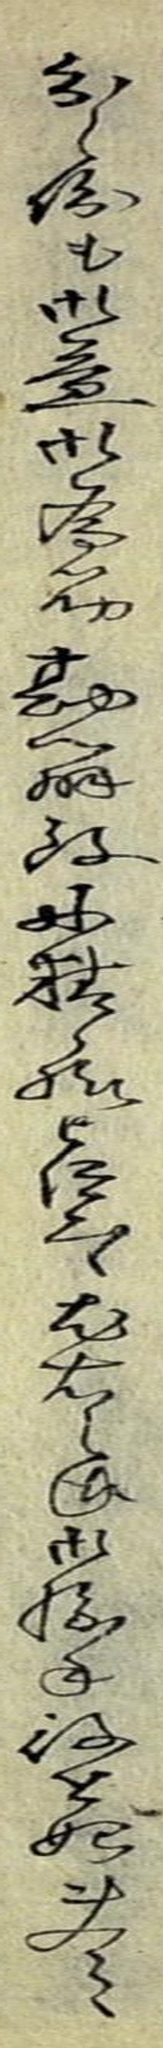分之儀も御益御為筋勘弁致丹精候様被仰出候尤右之趣御勝手役を始夫々
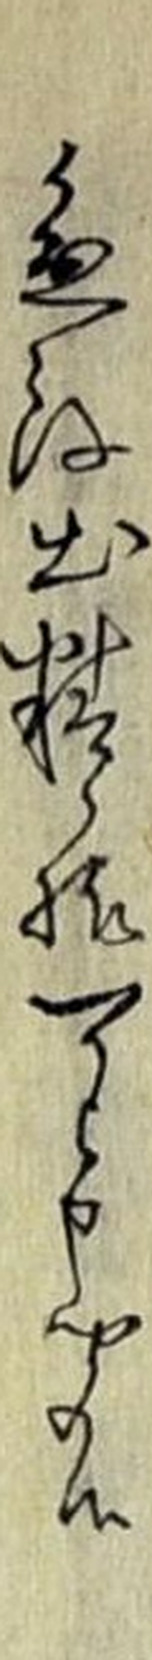愈致出精候様可被申聞候
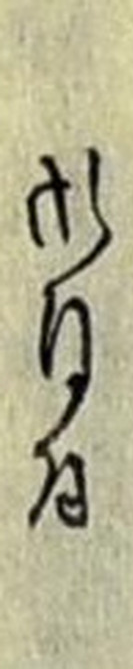御目付
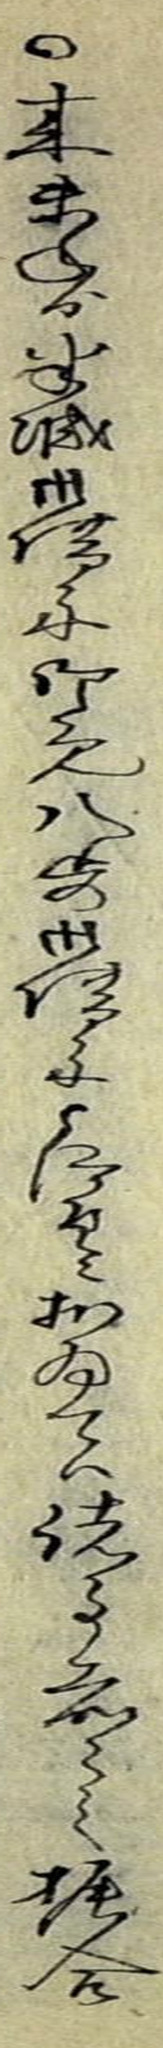○来未年ゟ半減御借米御免八歩御借米被仰付ニおゐてハ諸事前々之振合
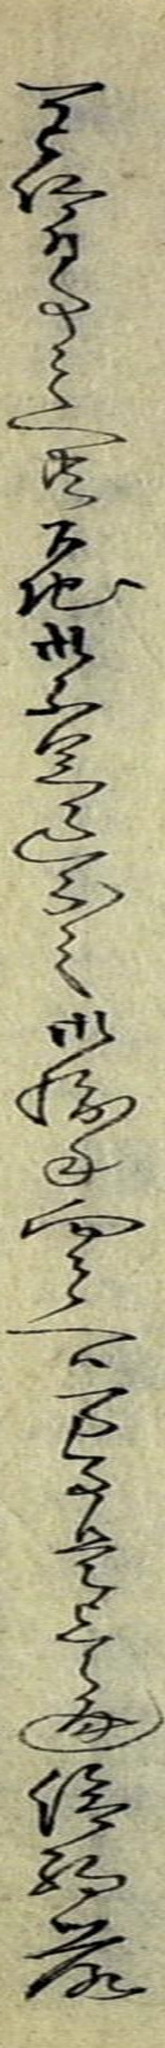可被仰付事ニ候へ共下地御不宜過分之御勝手向ニ候へハ万事是迄之通倹約厳
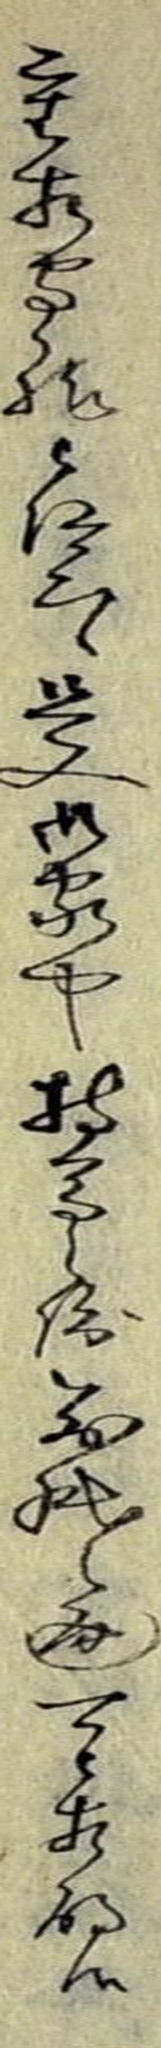重相守候様被仰出候且又家中持高之儀別紙之通可被相触候
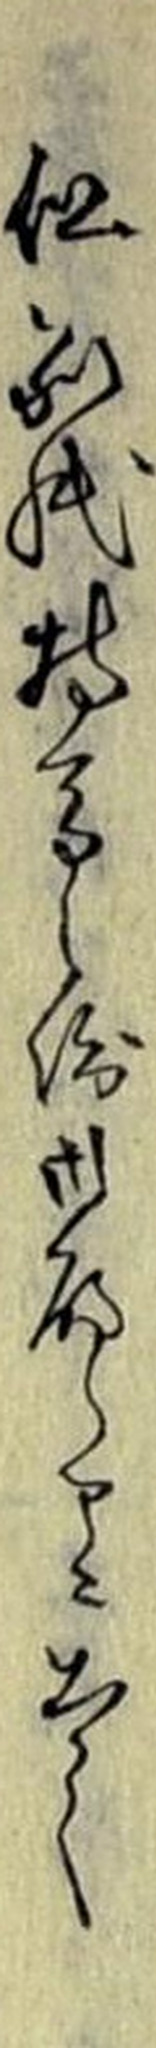但別紙持高之儀御触之中ニ出之
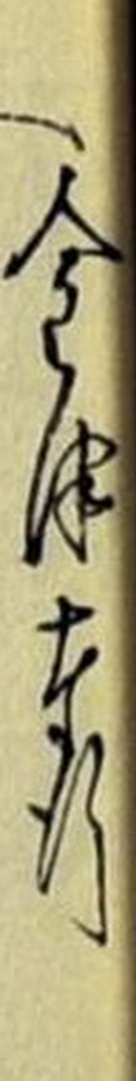金津奉行
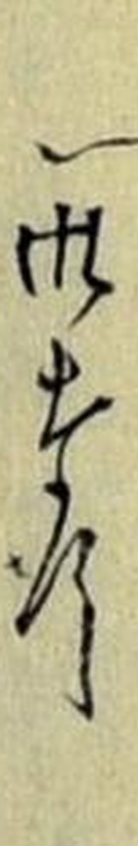御奉行
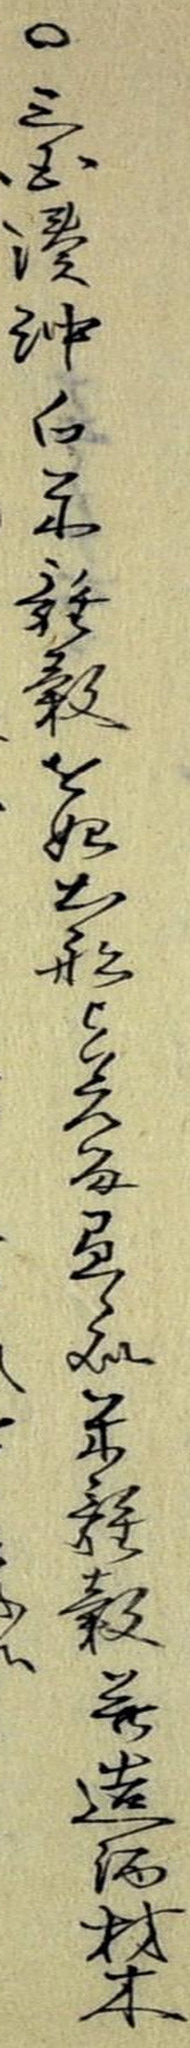○三国湊沖白米雑穀を始出船被差留置候処米雑穀并造酒材木
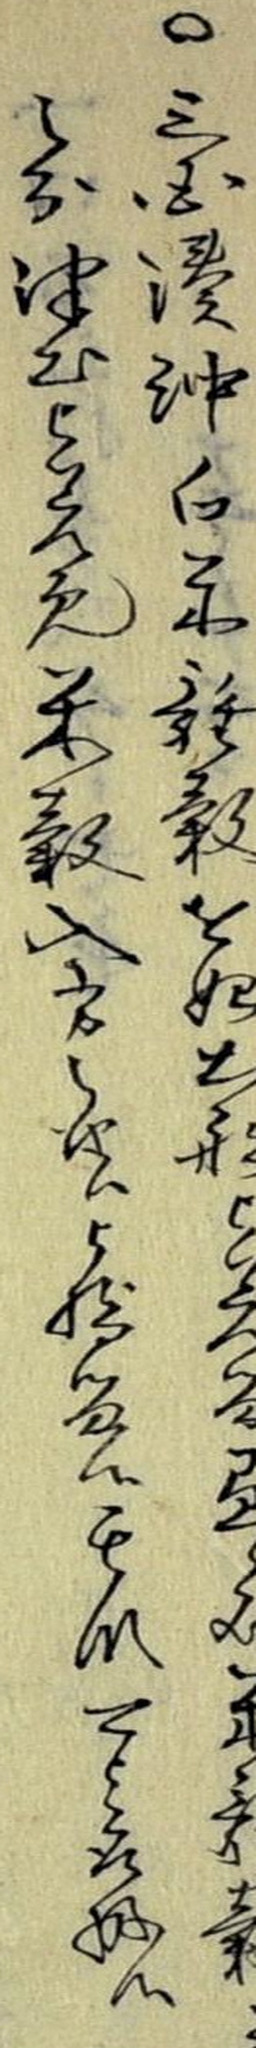之分津出被差免米穀入方之儀ハ被指留候其段可被取扱候
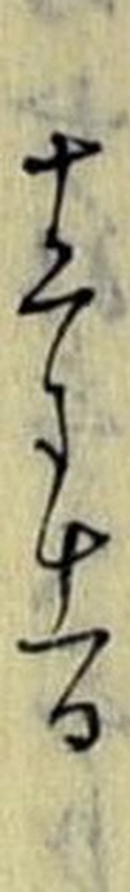十二月十一日
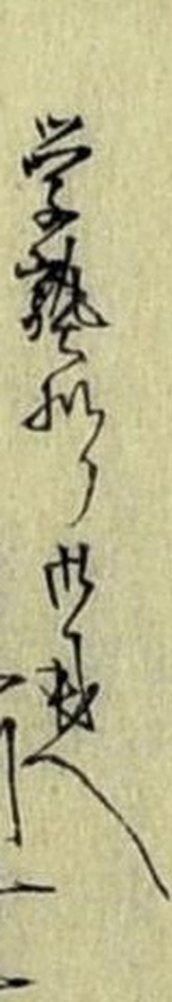学塾掛り御用人
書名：命令之部 五
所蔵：福井県文書館 Fukui Prefectural Archives
